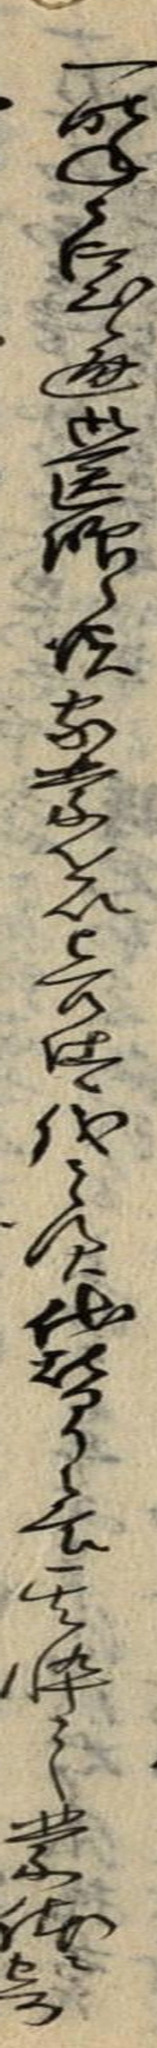一昨年被仰出候通御医師之儀は家業を以被召仕候儀に候得は代替り之節其忰之業体に寄
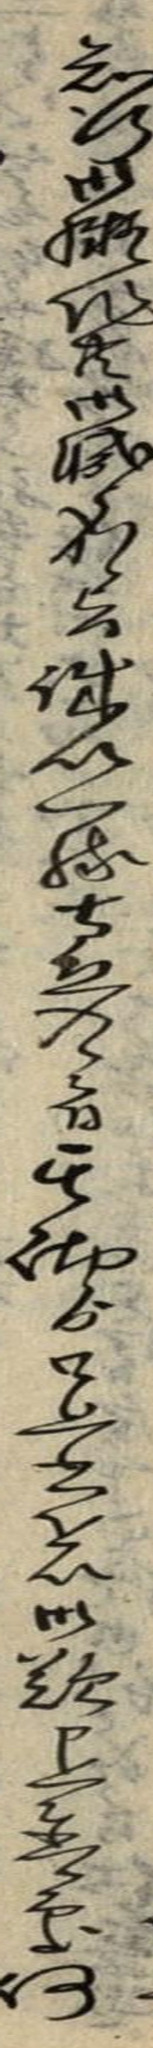知行御擬作とも御減被成候旨誠以一統奉恐入候に付其砌ゟ口上書を以御歎申上置候処何
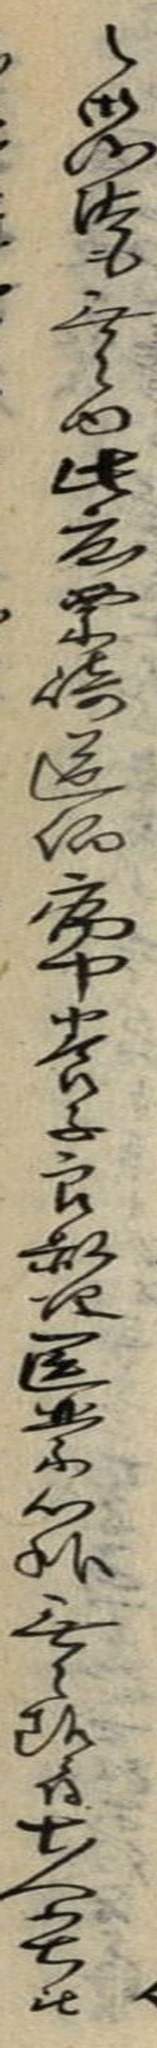之御沙汰も無之内此度栗崎道伯病中養子良叔儀医業心掛無之趣に付十人ふち被
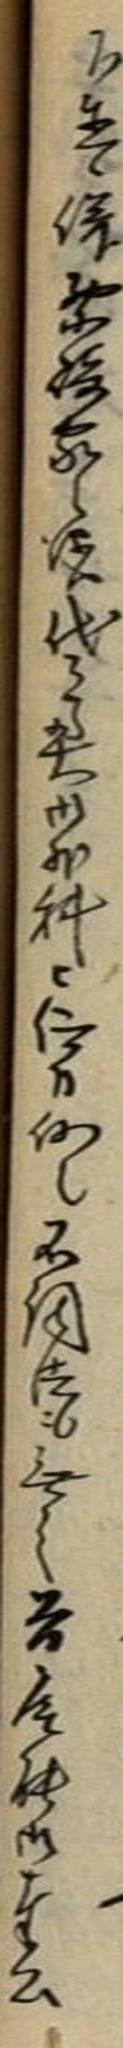下置候併栗崎家之儀は代々奥御外科被仰付何之不調法も無之首尾能御奉公
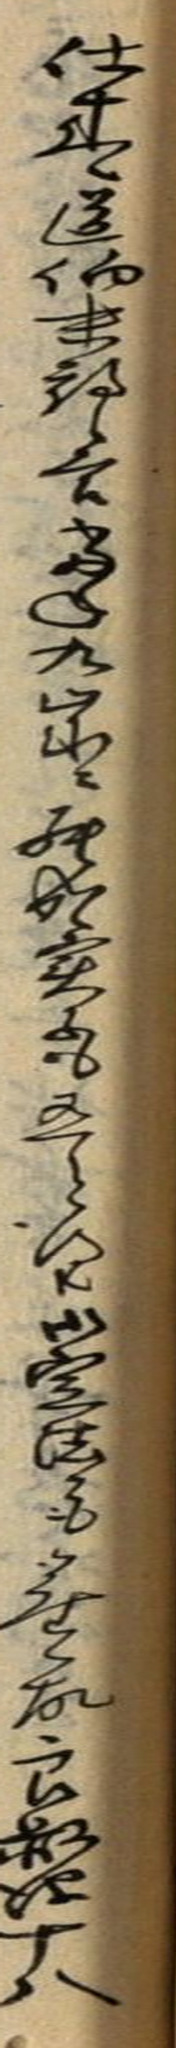仕来候道伯未期之節当年九歳に罷成候実子も有之候得共御定法にも御座候故良叔儀十八
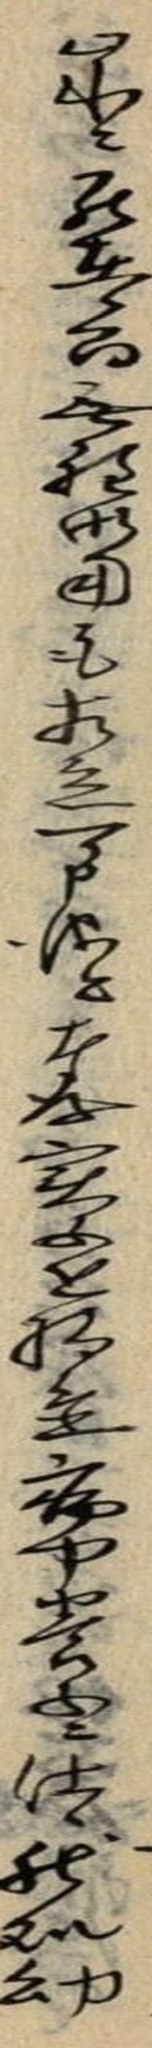歳に罷在候間無程御用にも相立可申儀と奉存実子を指置病中養子に仕候然処幼
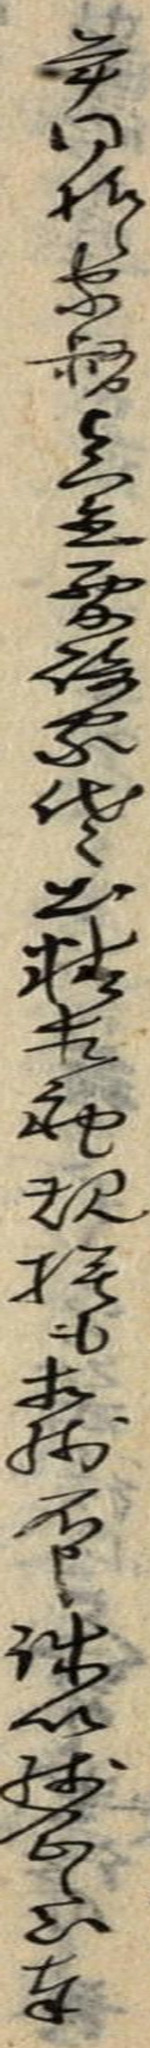年同様之家督被下置栗崎家代々出精相勤候規摸も相残不申誠心残念之至奉
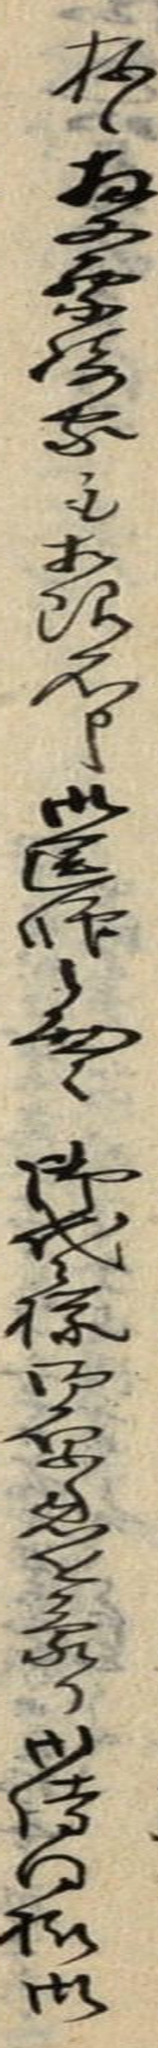存候扨又栗崎家にも相限不申御医師之面々御代々様御厚恩を蒙り御侍同様御
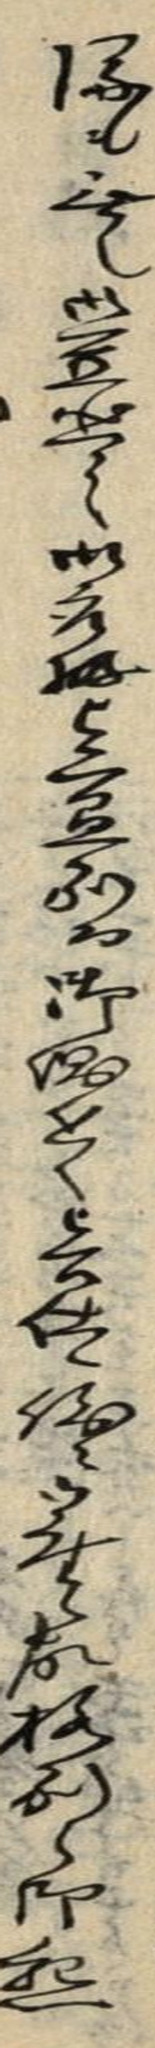も無之御慈悲之御取扱被下置別而御側近く被召仕候儀に御座候故格別之御懇
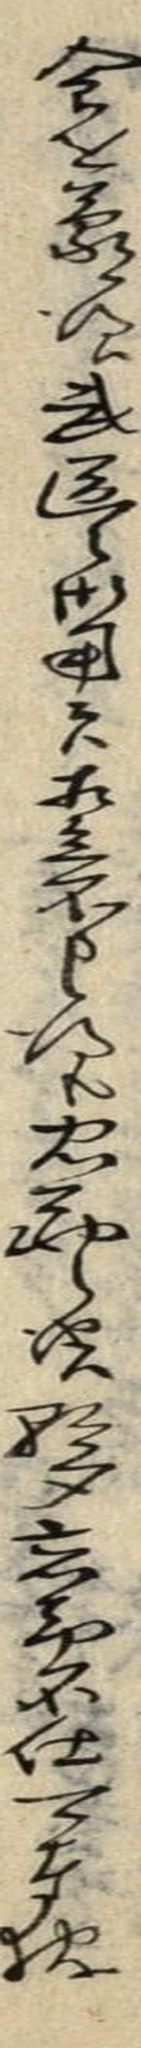命を蒙候得は武道之御用には相立不申候得共忠勤之儀は朝夕忘却不仕可奉報
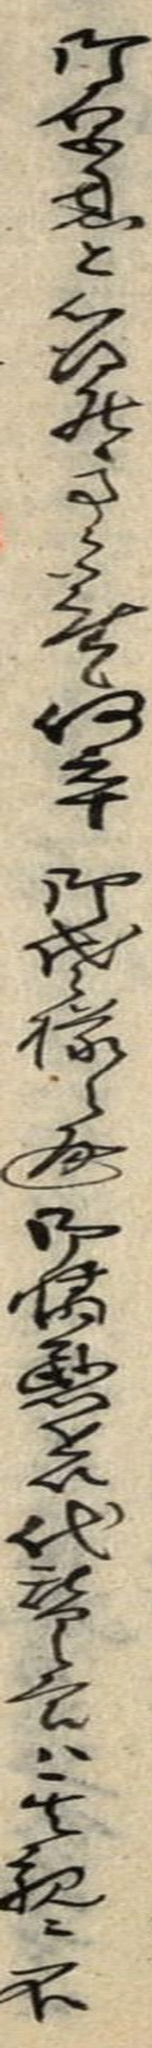御厚恩と心得居候事に御座候何卒御代々様之通御憐愍を以代替之節は其親に不
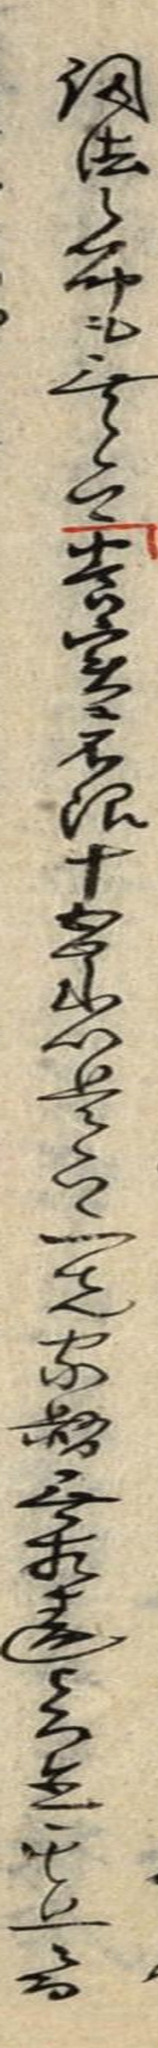調法之筋も無之候はゝ「養実に不限十五歳以上に候はゝ一先家督無相違被下置其上に而
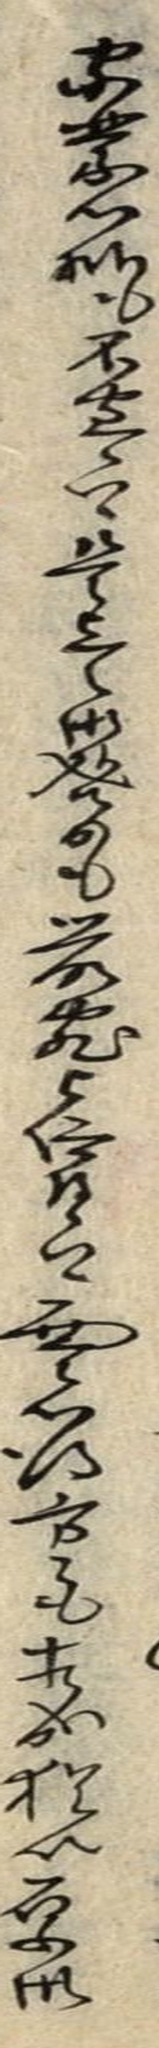家業心掛も不宜候はゝ是迄之御咎ゟも厳敷被仰付候はゝ面々心得方にも相成猶以厚御
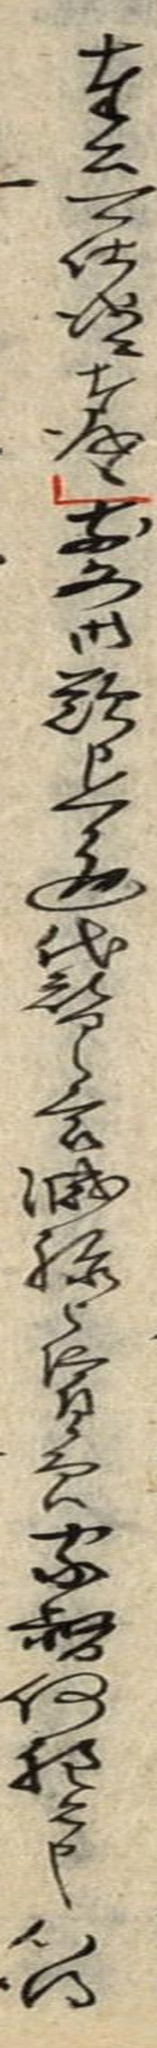奉公可仕儀に奉存候」前文御歎申上候通代替之節減禄被仰付候而は家督何程と申心得
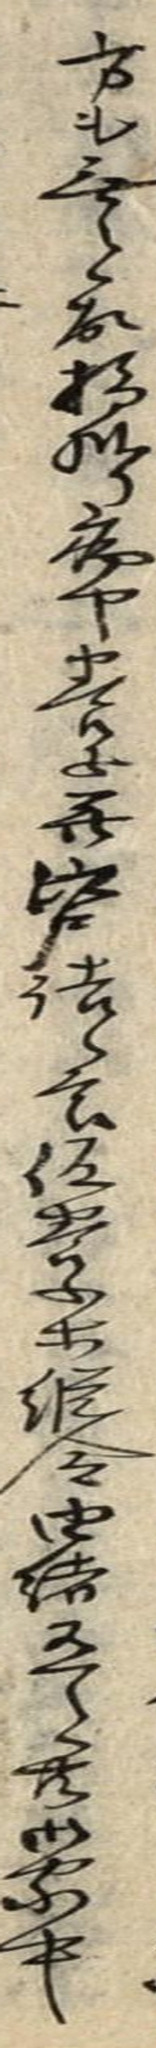方も無之候故指掛り病中養子并江戸詰之節仮養子等縦令由緒有之候共御家中
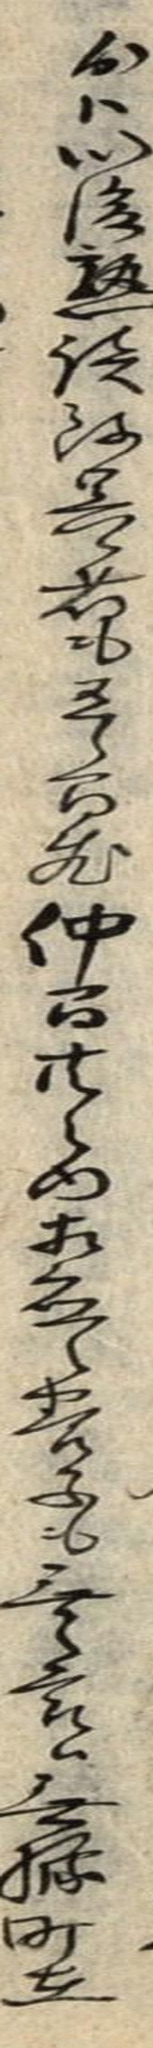ゟは以後熟談致呉候者も有之間敷仲間共之内相応之養子も無之節は無拠町在
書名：御用并被仰出之部
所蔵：福井県文書館 Fukui Prefectural Archives
